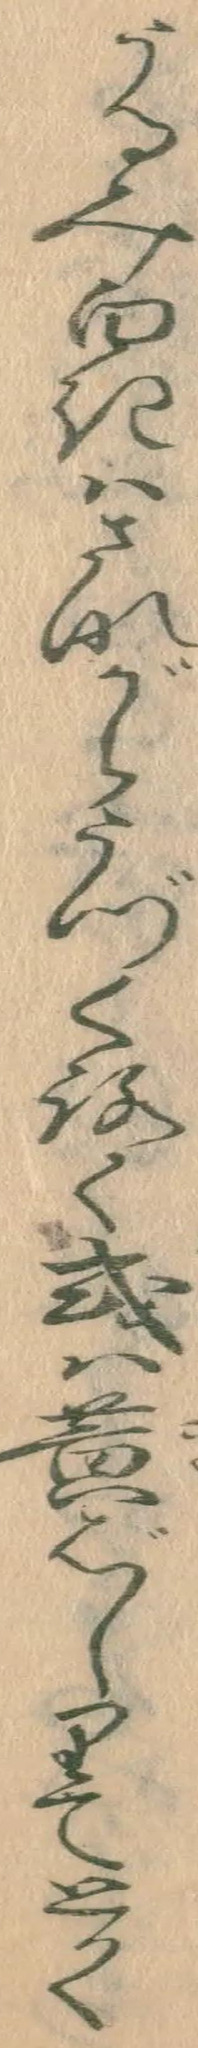うるみ白きはさながらうづくろく或は黄ばしりてとかく
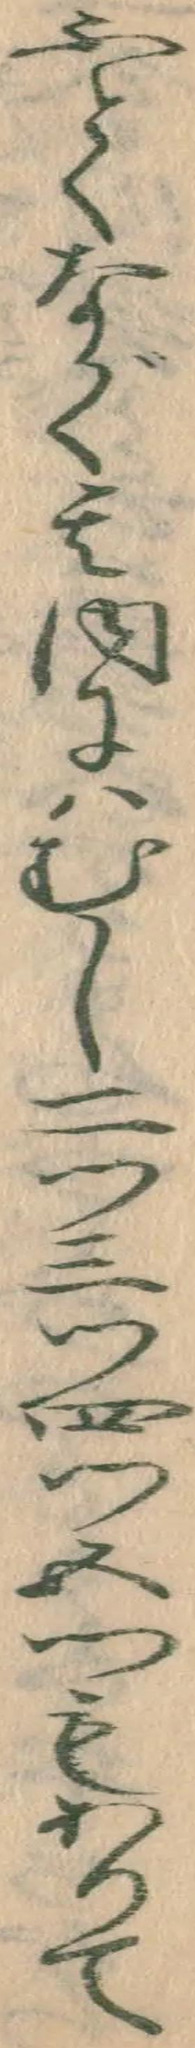ふとくながく其内にはむし二つ三つ四つ五つもありて
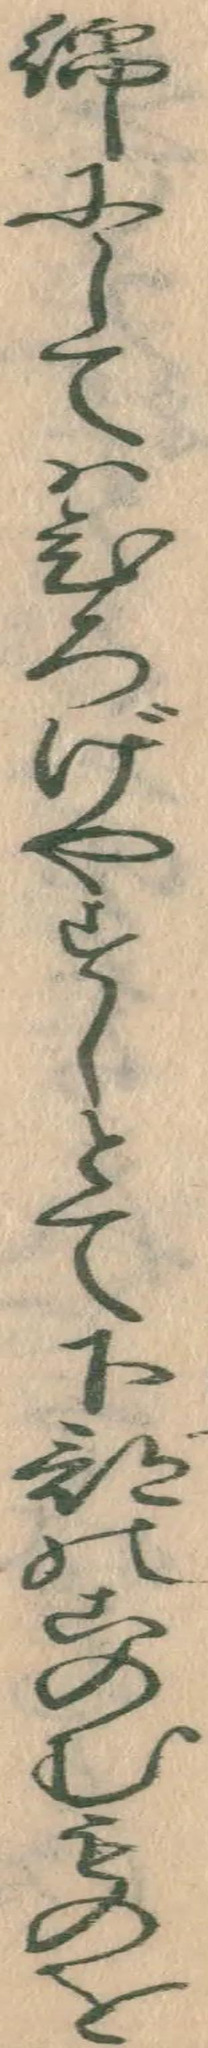綿にしてはひろげやすしとて下部のこのむものを
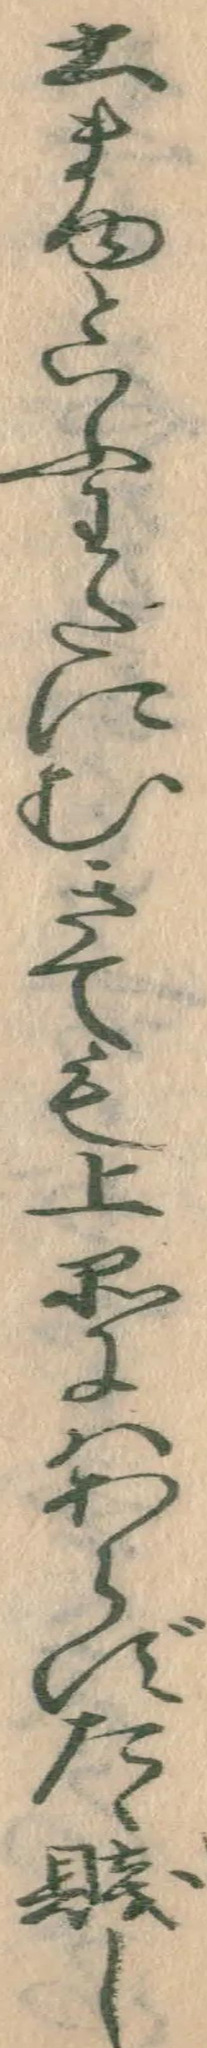土まゆといふわだにむきても上品にはあらずたゝ賤し
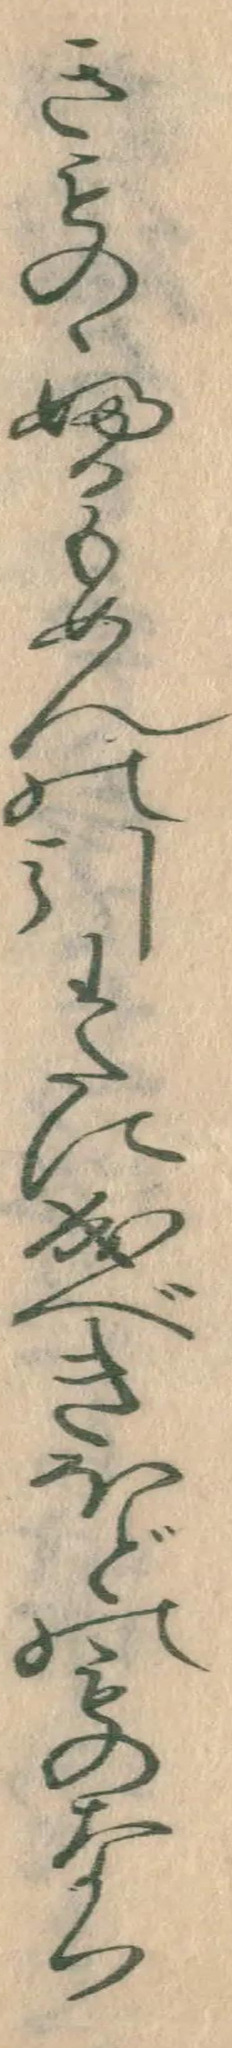きものゝふるもめんの引わたに成べきほどのものなり
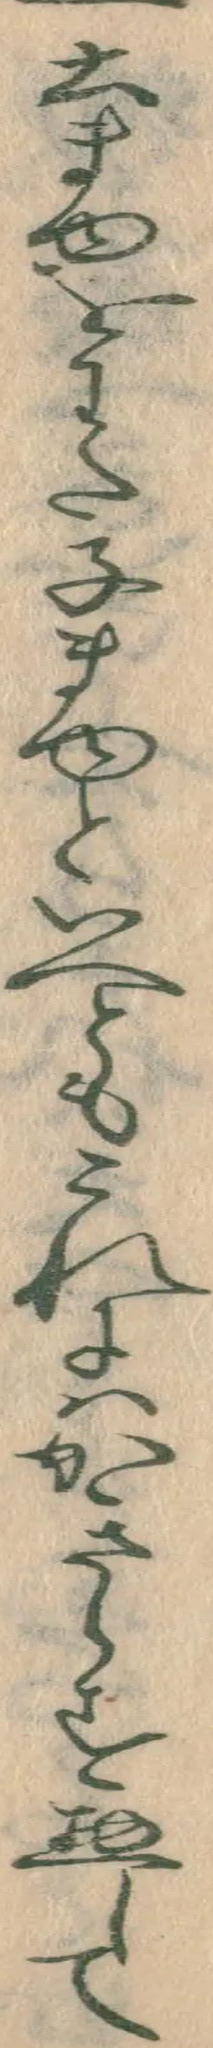一土まゆをわた子まゆといへともこれにはかきらす惣して
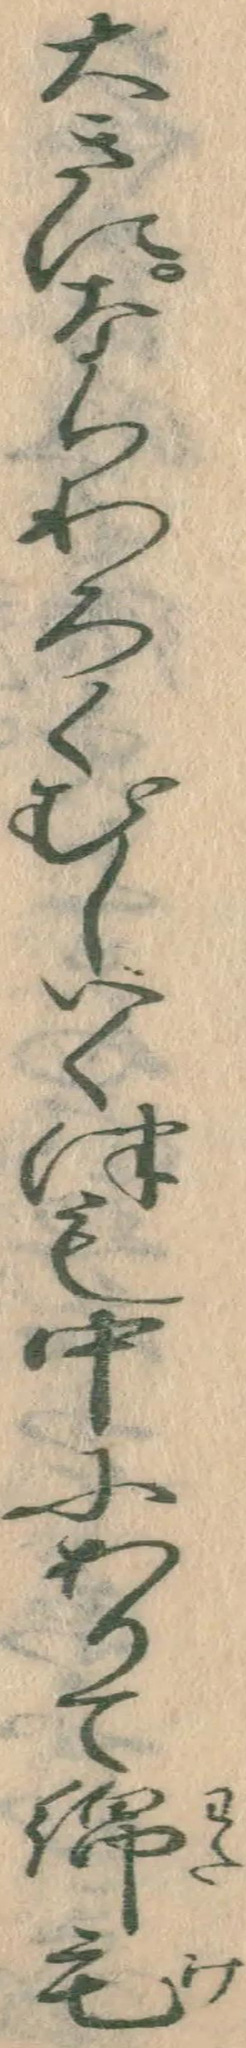大きに。なりわろくむしいくつも中にありて綿毛
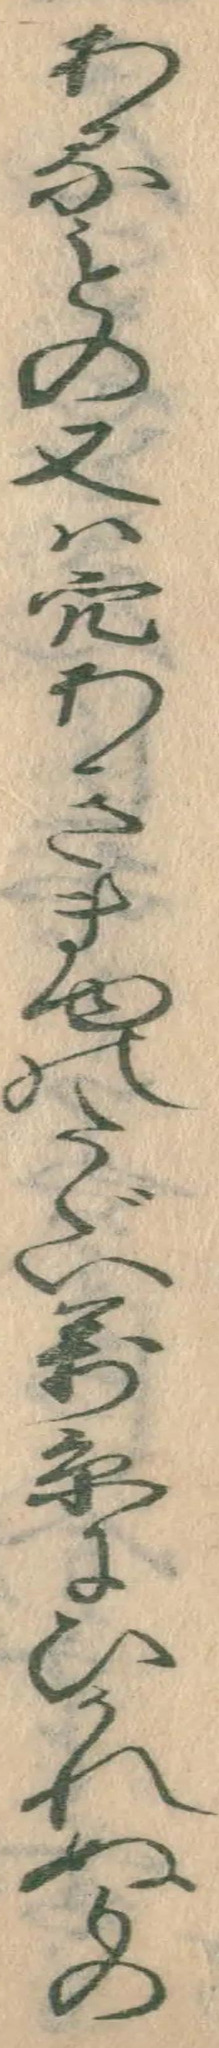あるもの又は穴あきまゆのたぐい万糸にひかれぬもの
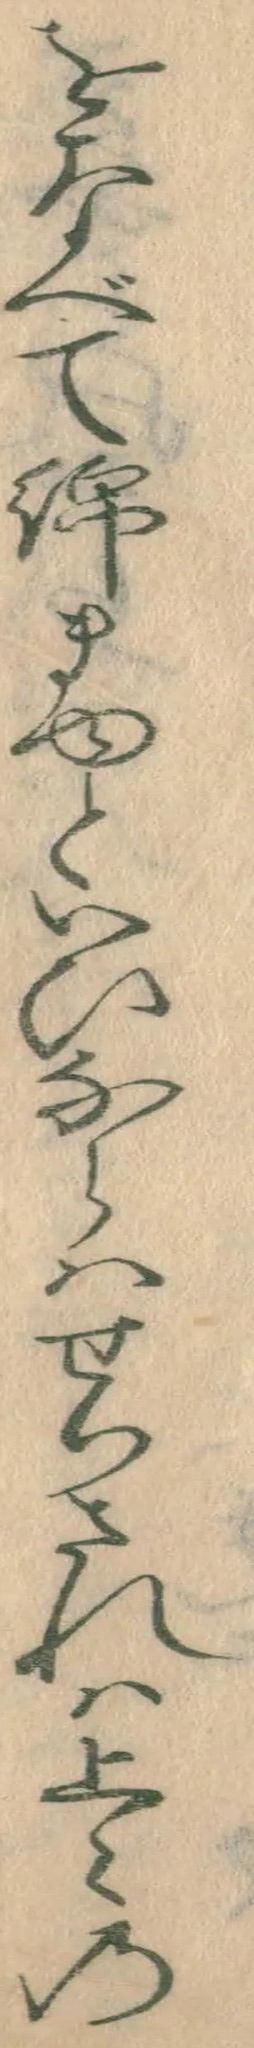をなべて綿まゆといひならはせりされは上々の
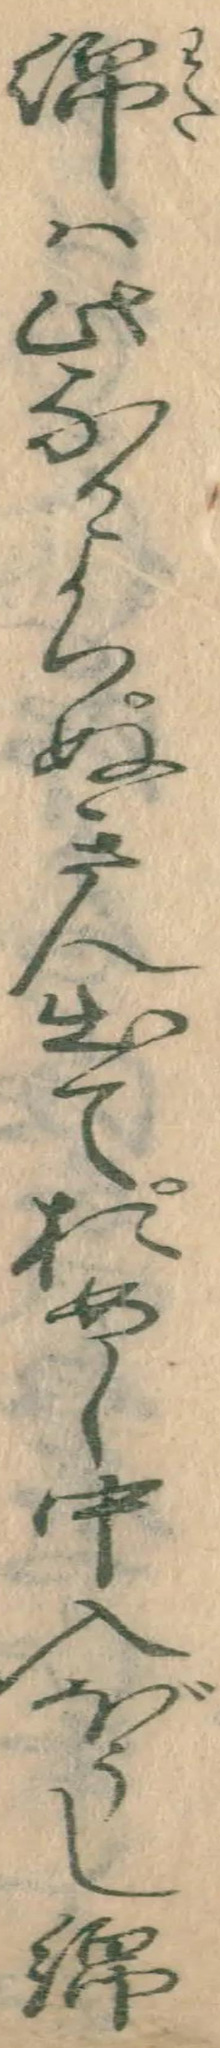綿は此なかより。ぬきん出て。おめし中入ぼうし綿
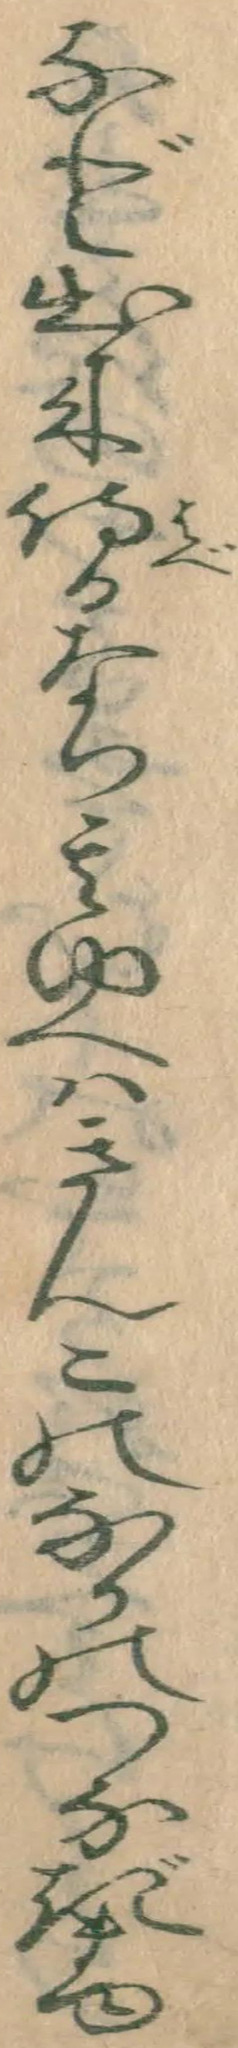など出来侍るなり其ゆへはきんこのなかのつなぎまゆ

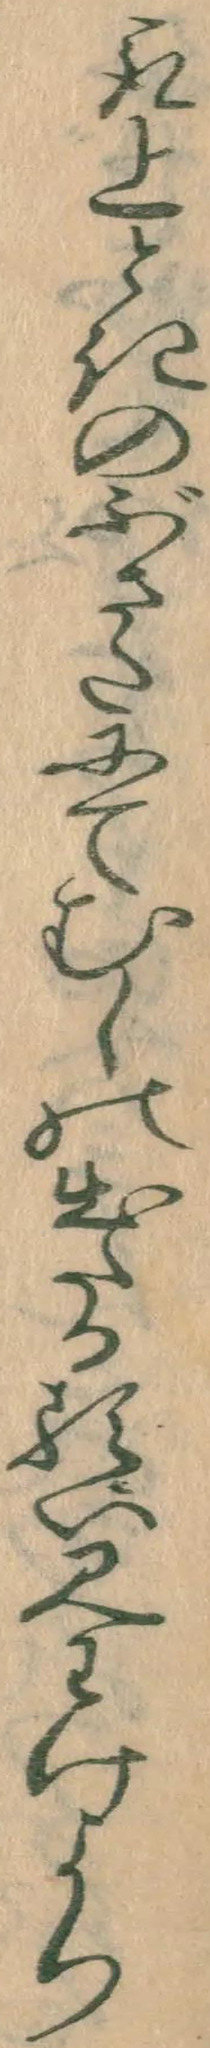取上ときのぶさたにてむしの出たる類い見わけより
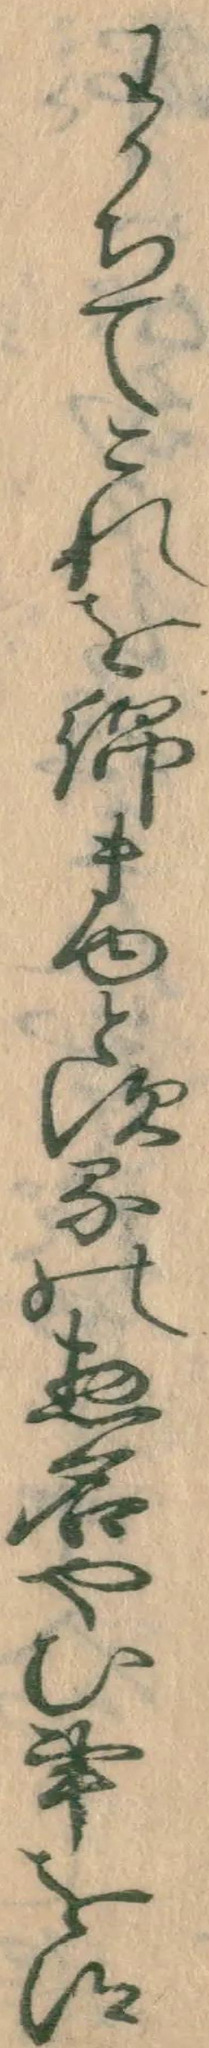わかちてこれを綿まゆとするの惣名やむ事を得
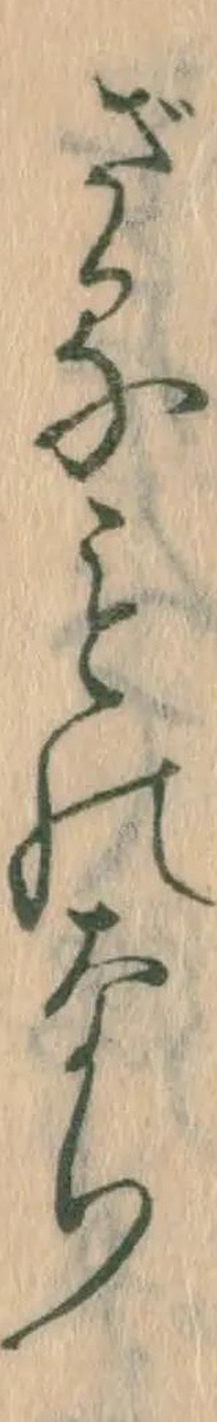ざるものなり
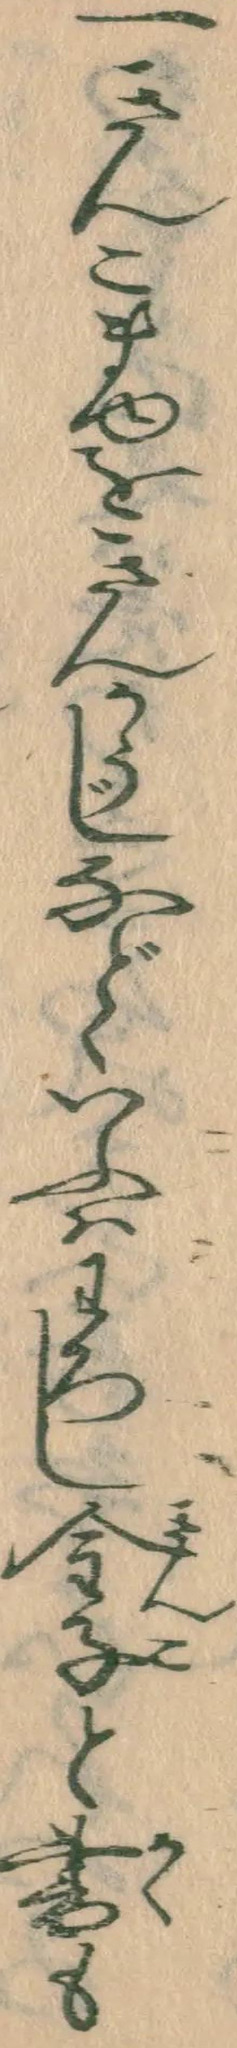一きんこまゆをきんかうじなどゝいふはわろし金子と書も
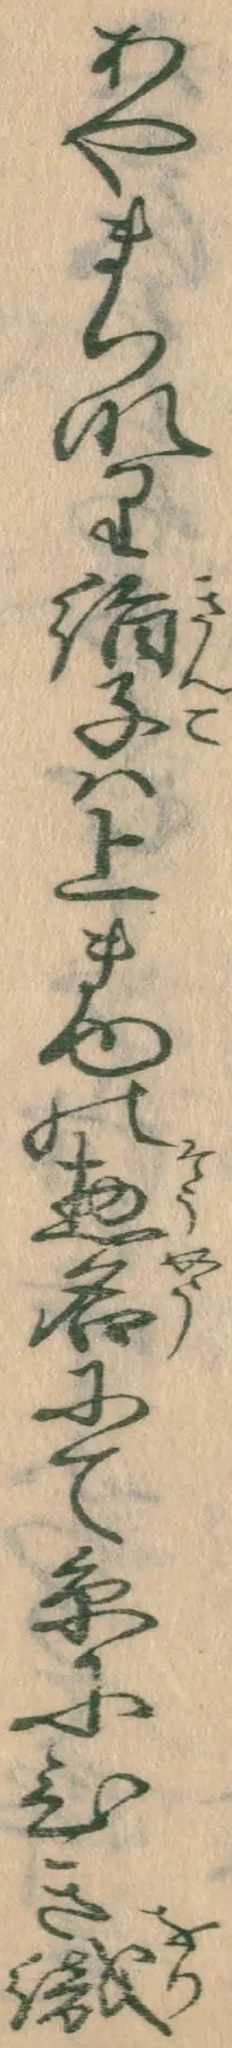あやまりなり絹子は上まゆの惣名にて糸にひき織
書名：蚕飼養法記
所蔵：国立国会図書館 National Diet Library, JAPAN
